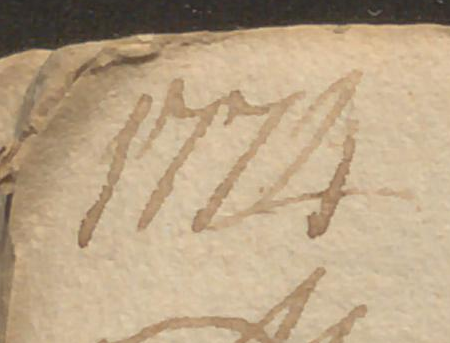1774
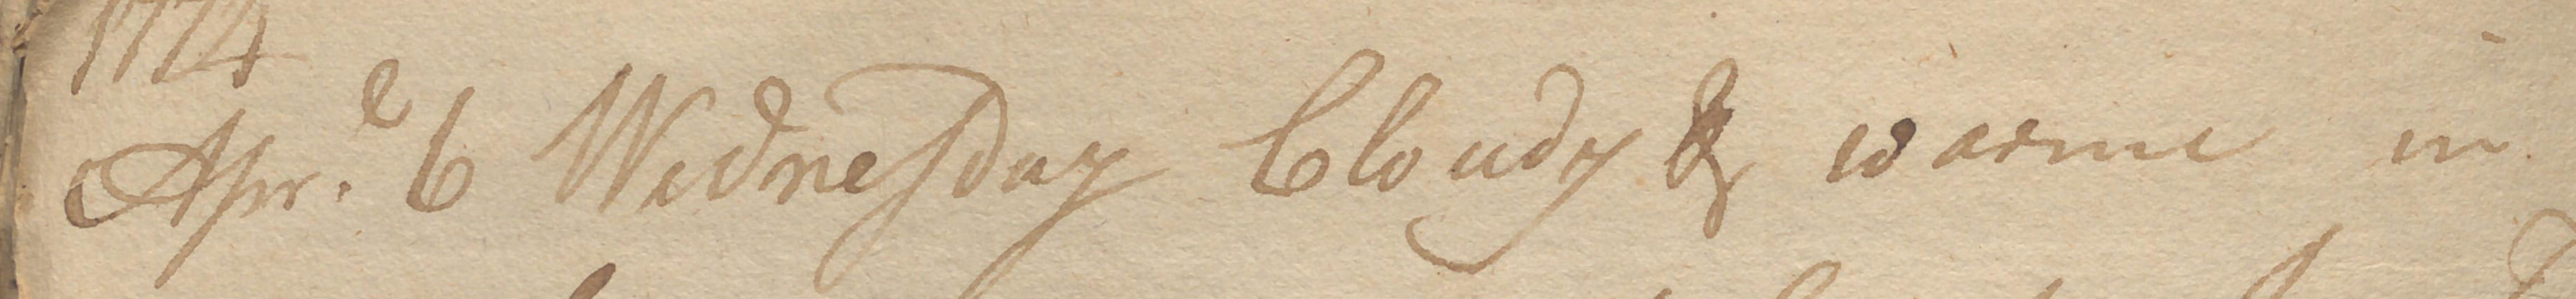Apr^l. 6 Wednesday Cloudy & warme in
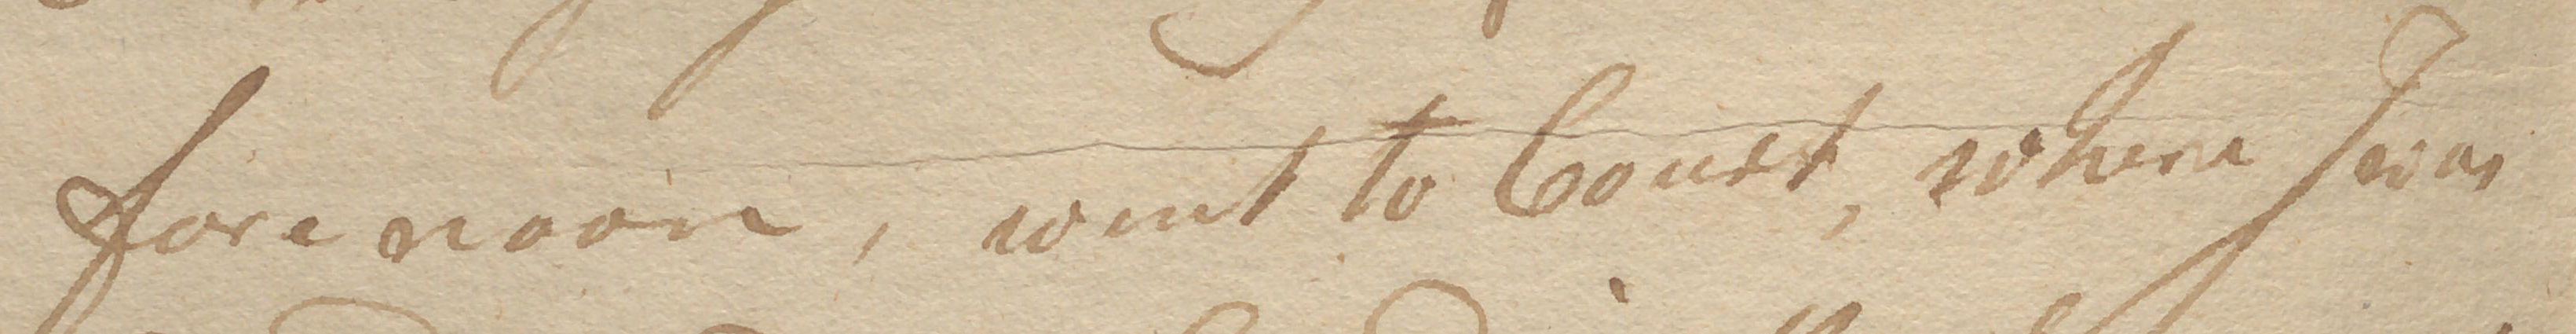forenoon, went to Court, where I was
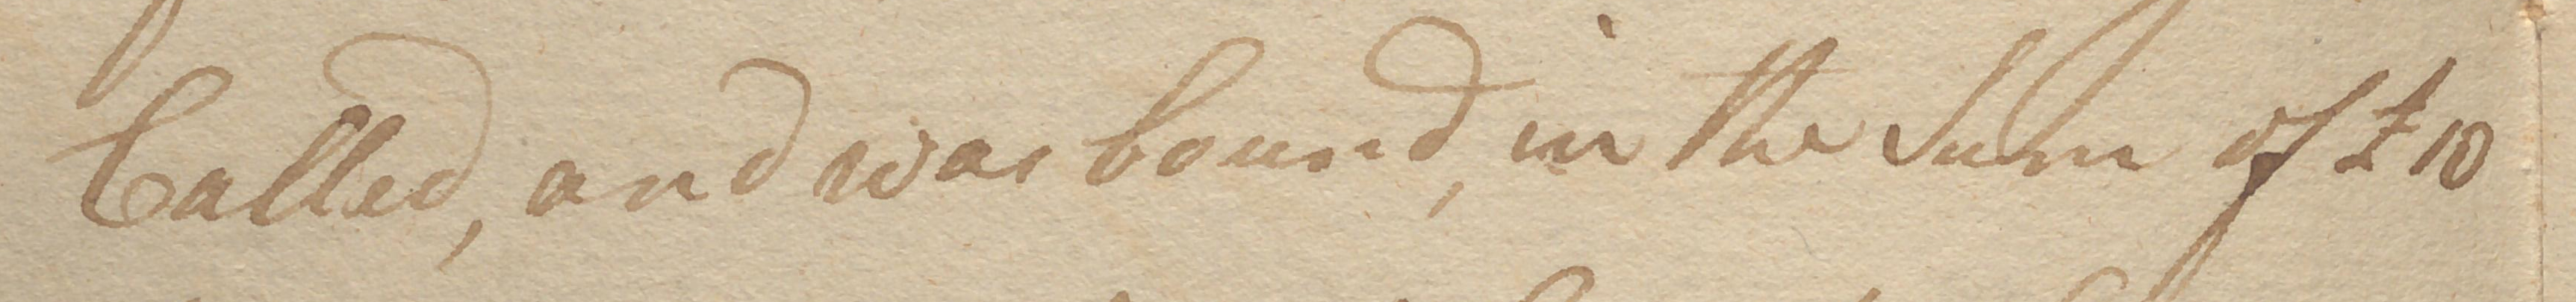Called, and was bound, in the Sum of £10.
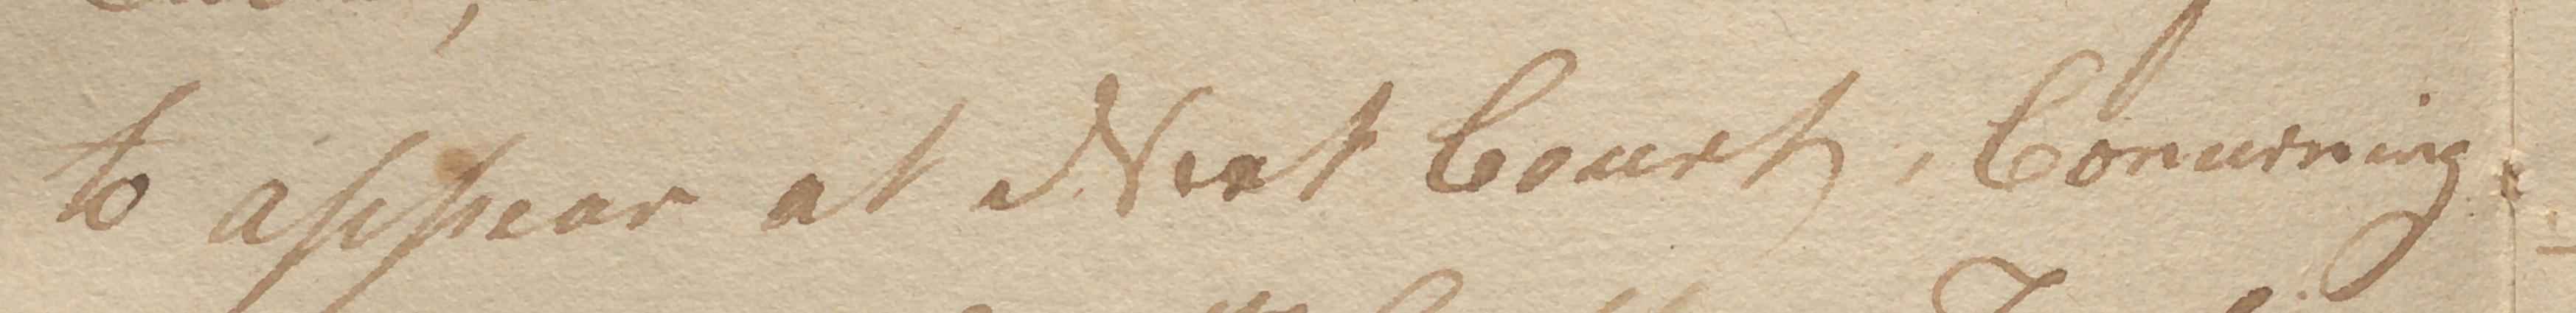to appear at Next Court, Concerning
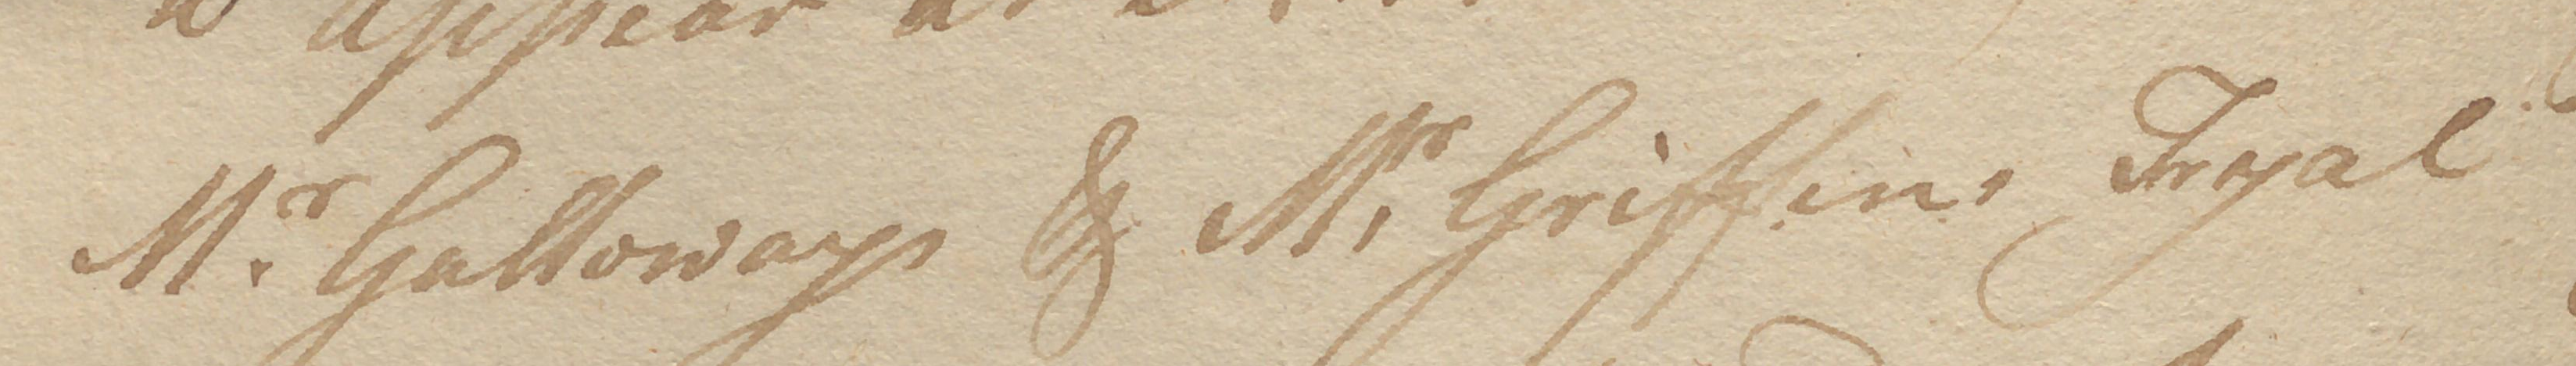M^r. Galloways & M^r. Griffins Tryal
